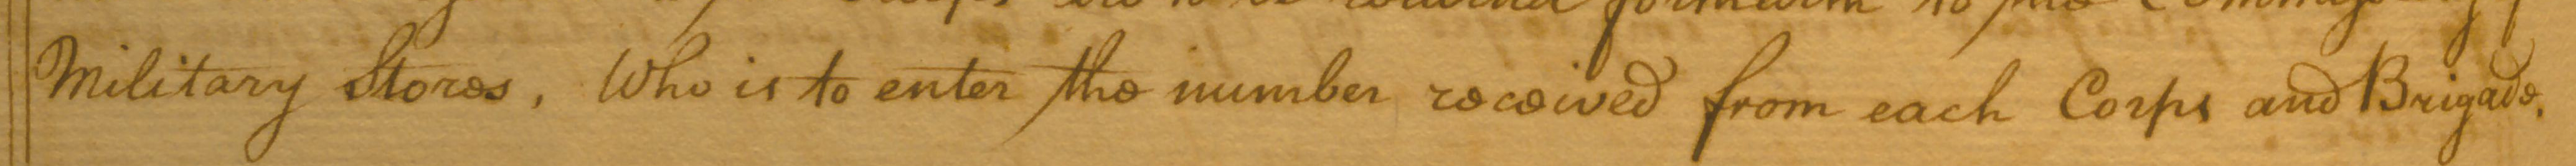Military Stores. Who is to enter the number received from each Corps and Brigade
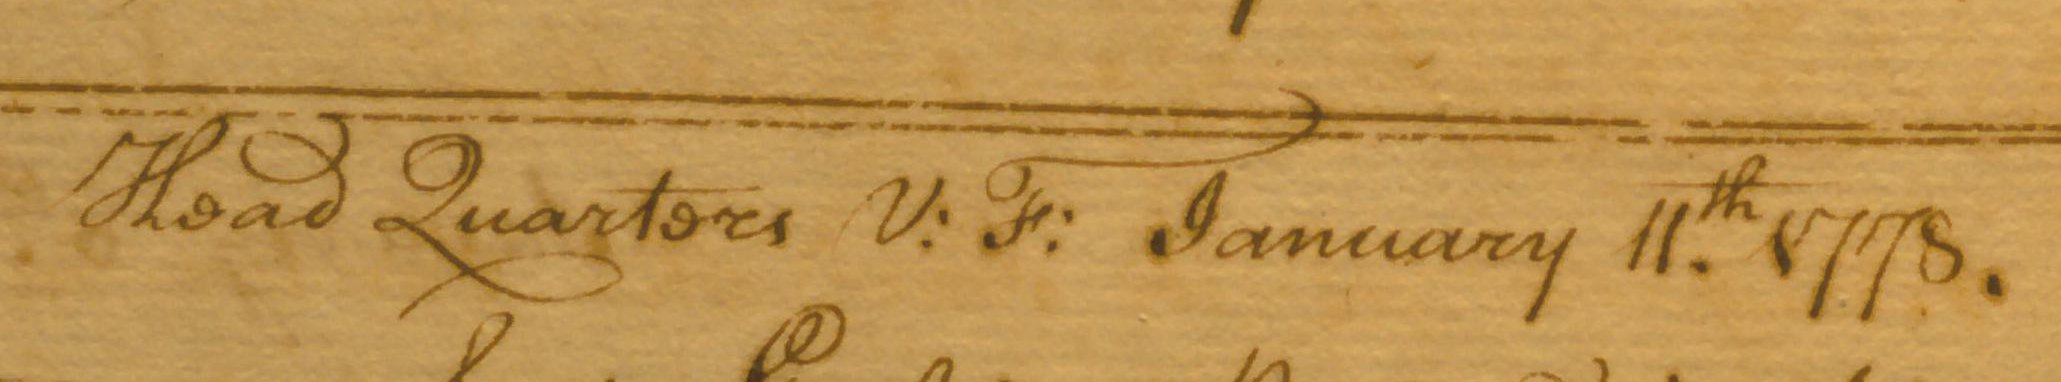Head Quarters V: F: January 11^th. 1778.
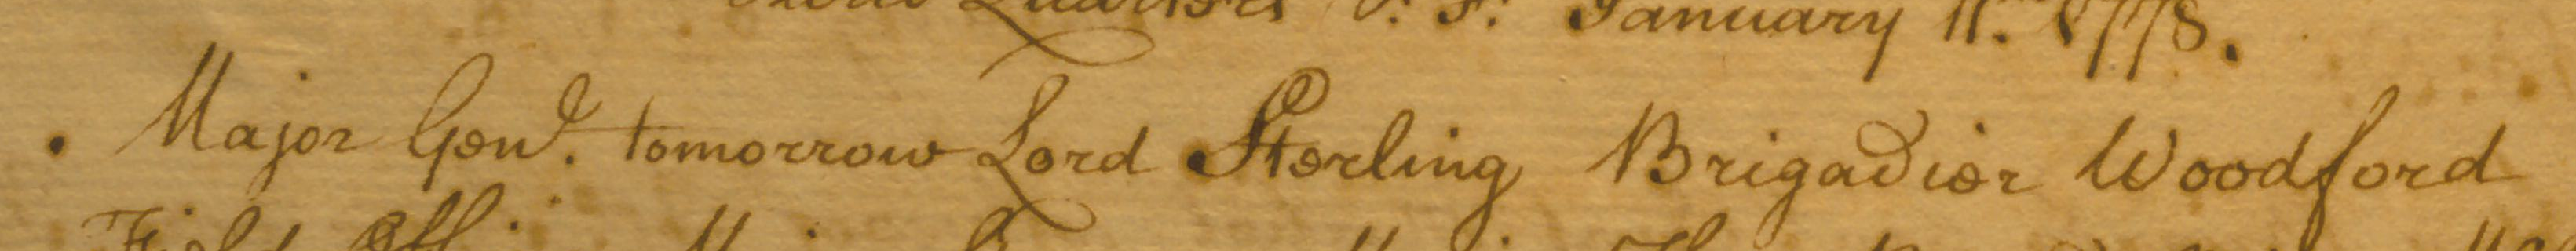Major Gen^l. tomorrow Lord Sterling Brigadier Woodford
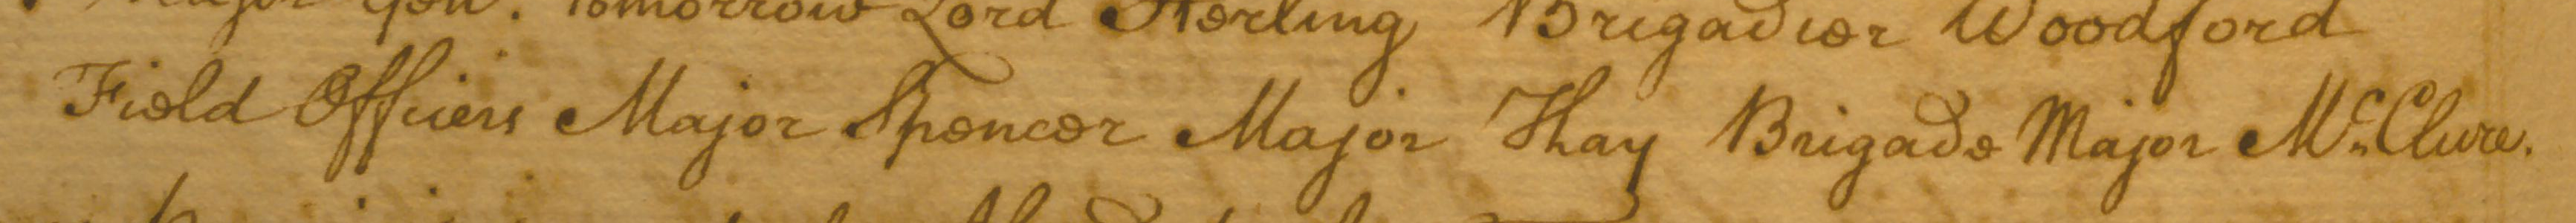Field Officers Major Spencer Major Hay Brigade Major M^c.Clure
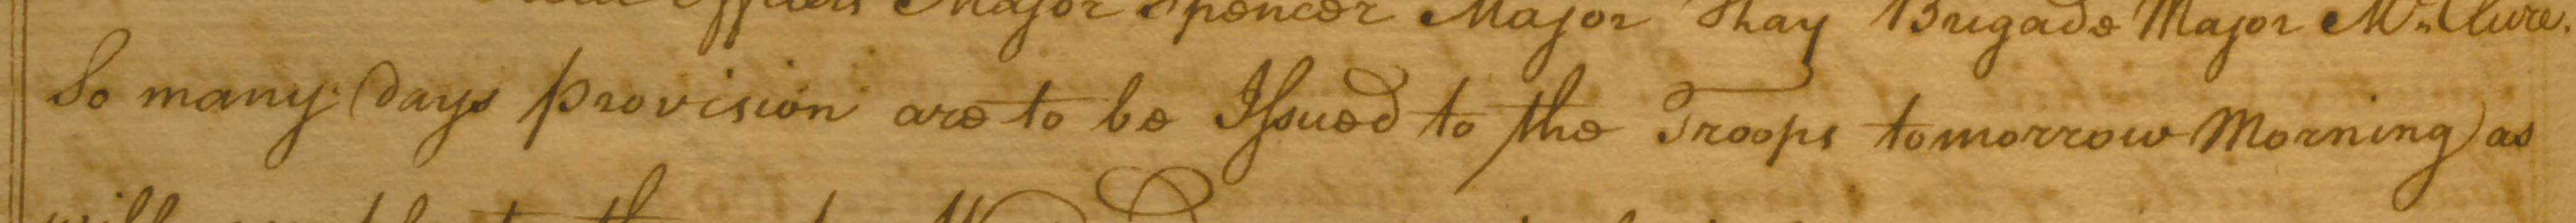So many days provisions are to be Issued to the Troops tomorrow morning as
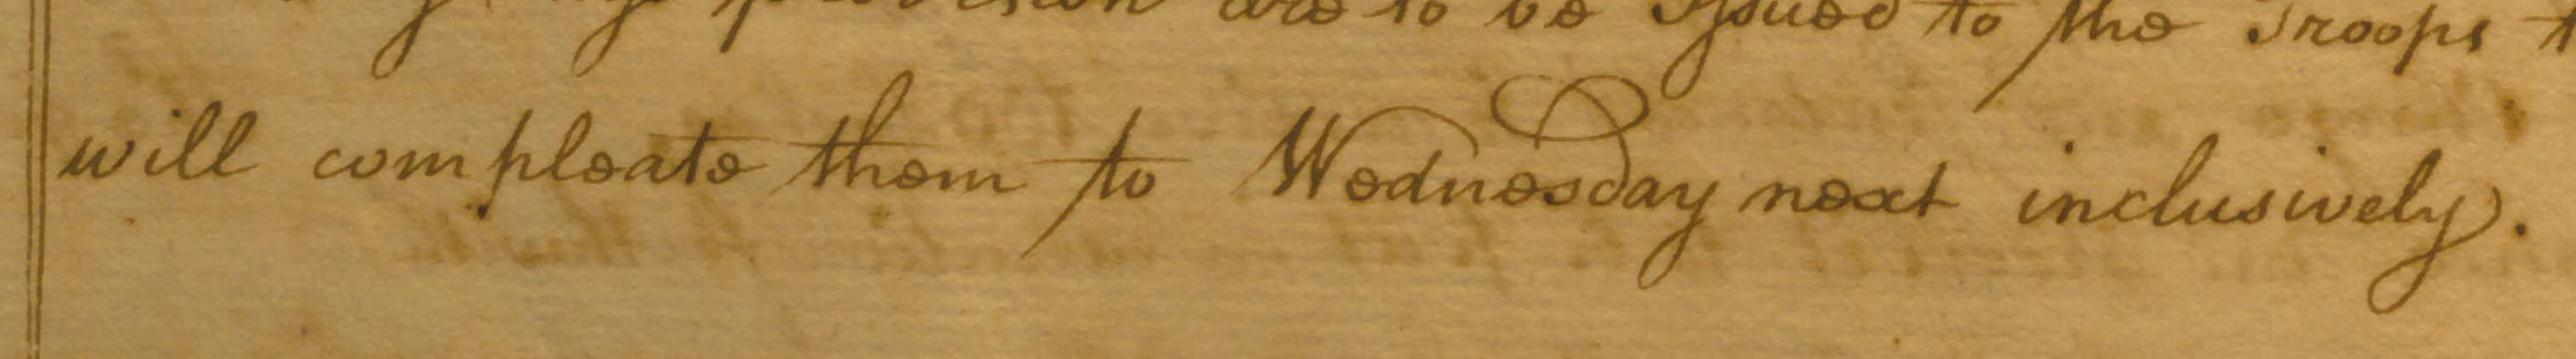will compleate them to Wednesday next inclusively.
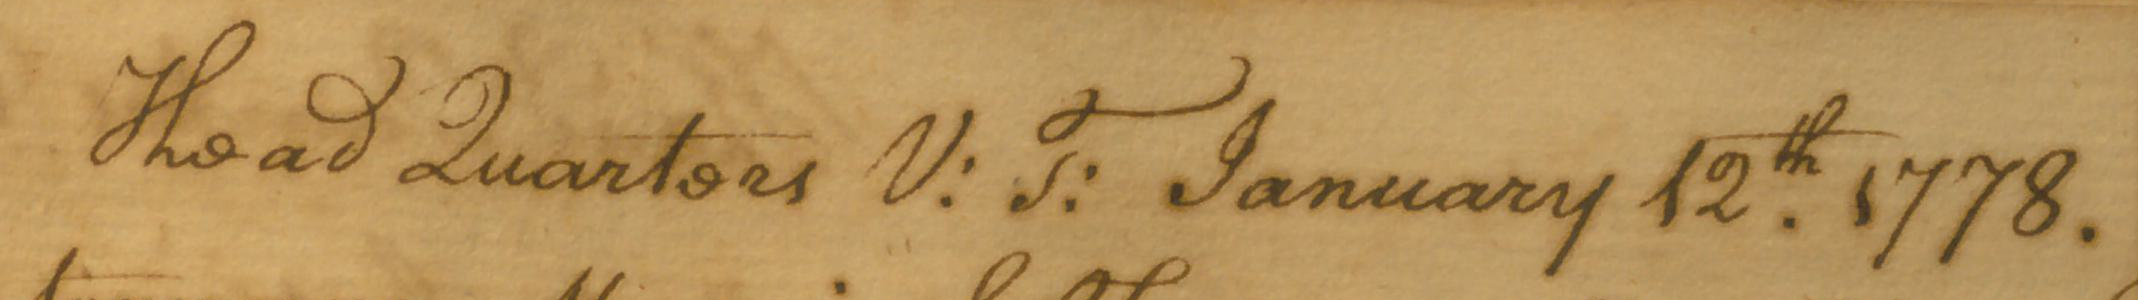Head Quarters V: F: January 12^th. 1778.
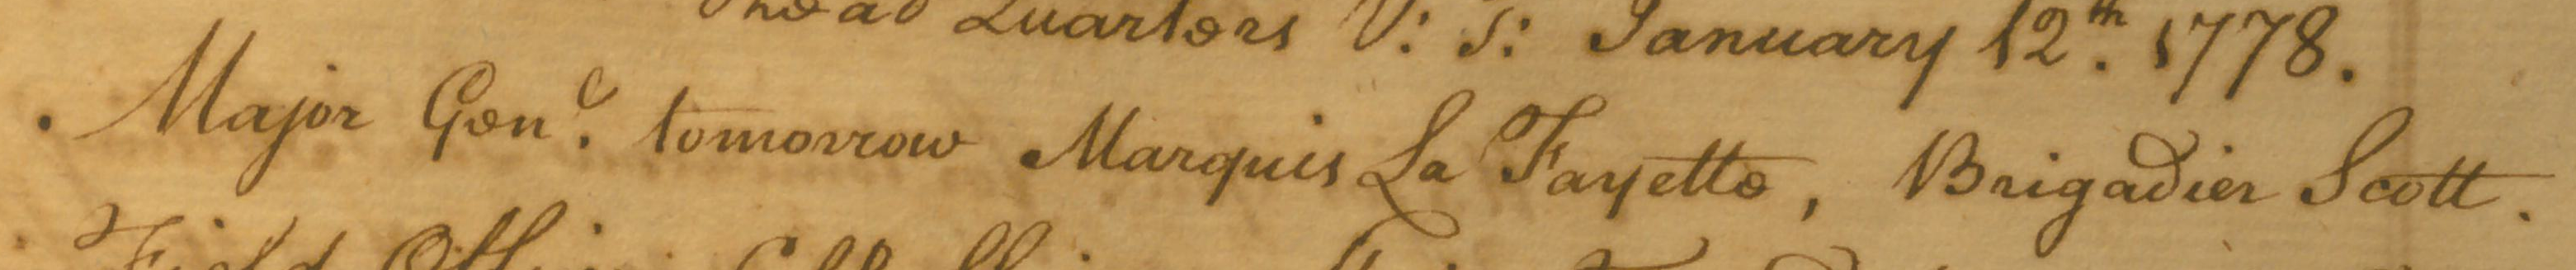Major Gen^l. tomorrow Marquis La Fayette, Brigadier Scott.
